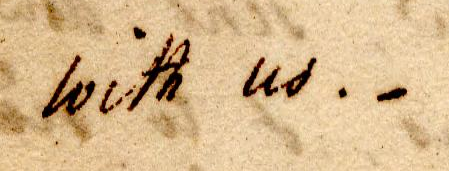with us.-
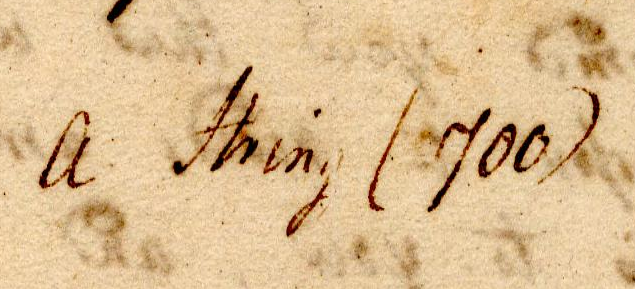A String (700)
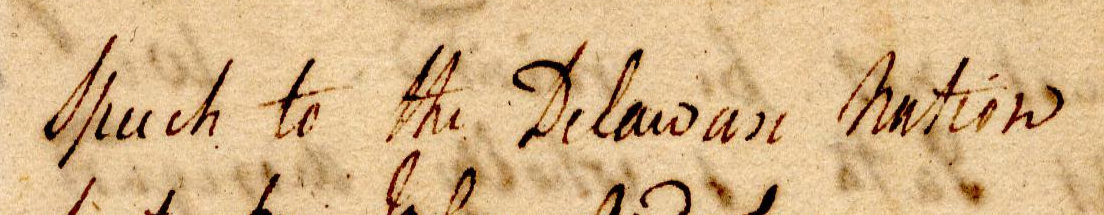Speech to the Delaware Nation
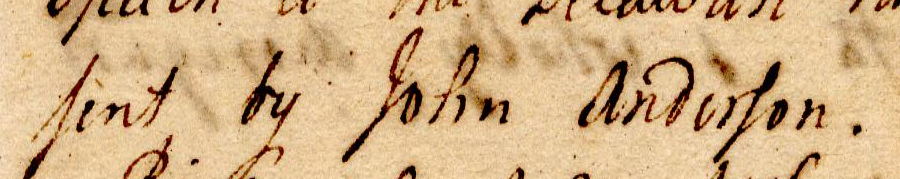Sent by John Anderson.
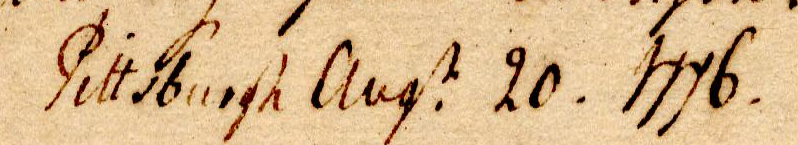Pittsburgh Aug^t. 20. 1776.
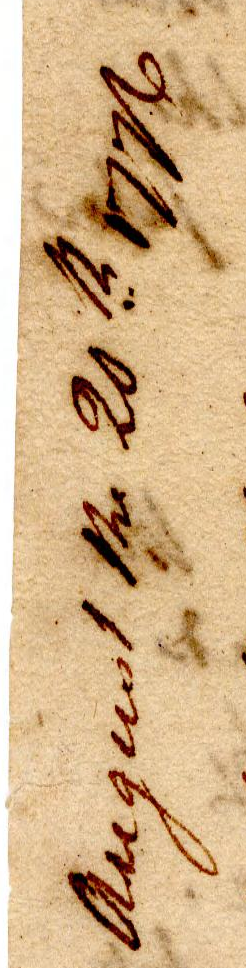August the 20^th. 1776
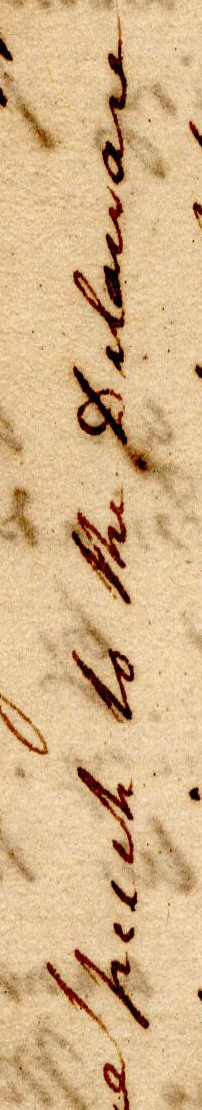Speech to the Delaware
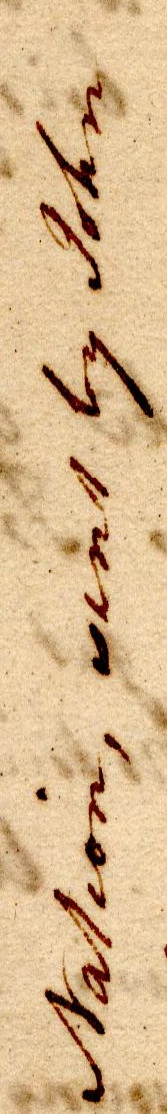Nation, sent by John
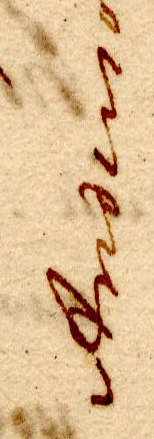Anderson.
